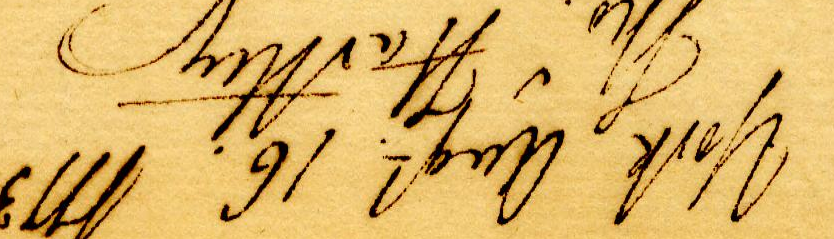York Aug^t. 16. 1773
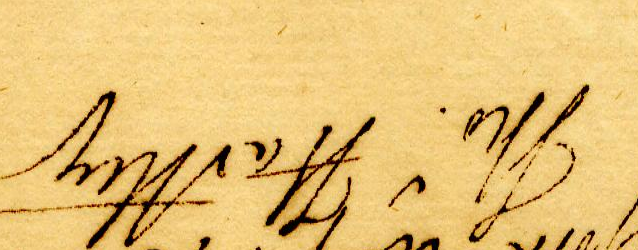Tho^s. Hartley
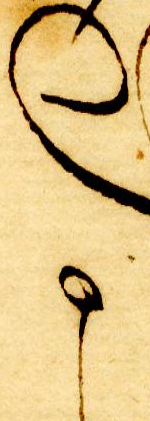To
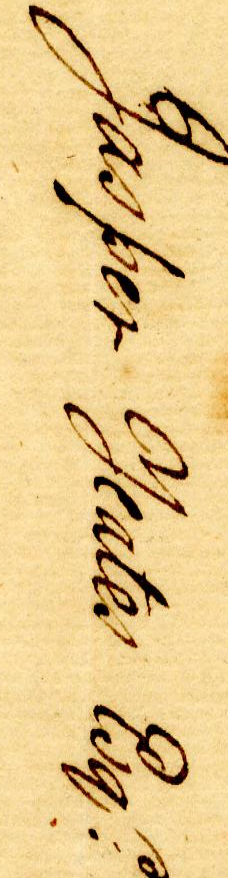Jasper Yeates Esq^r.
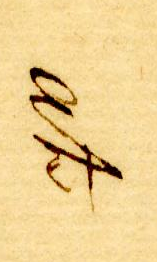at
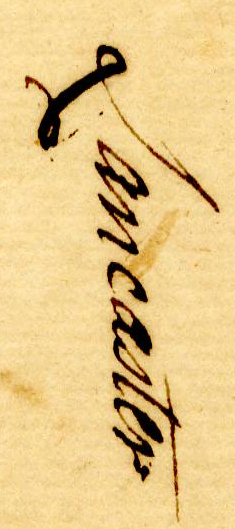Lancaster
